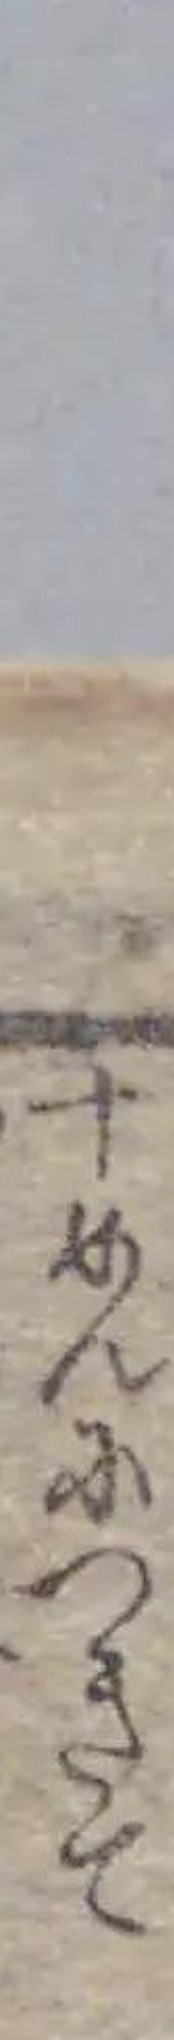十めんにつきて
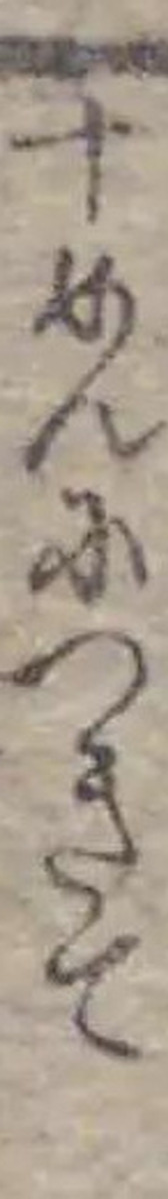十めんにつきて
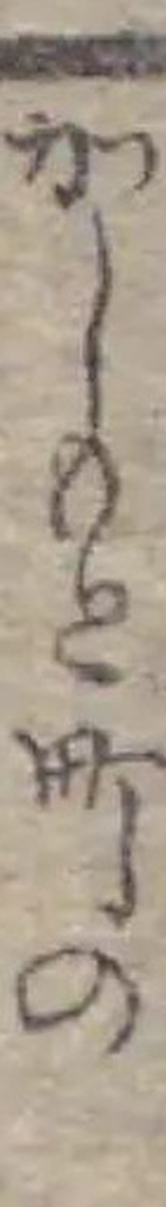かしもと町の
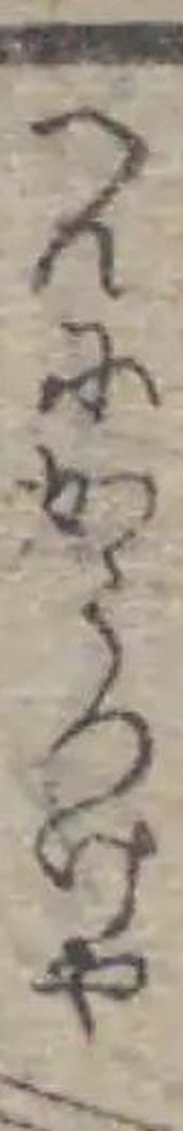へんにかうつけや
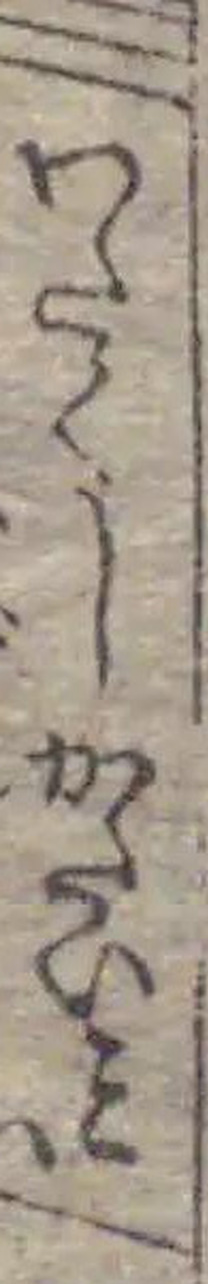わたくしかたいことは
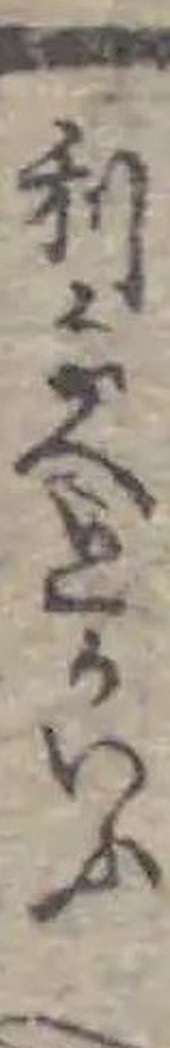利兵へとかいふ
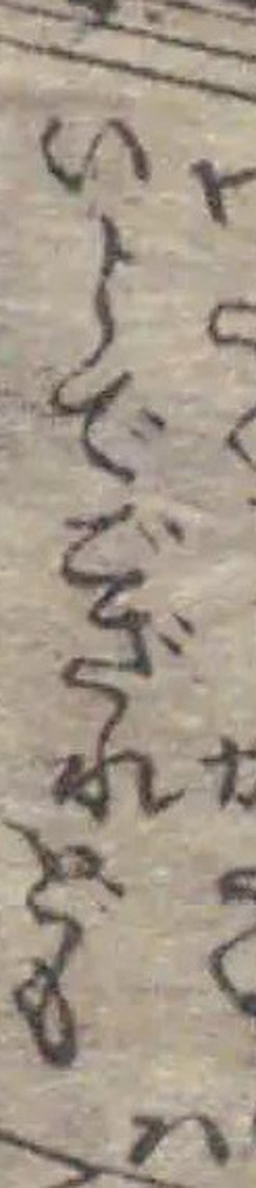いしでござれども
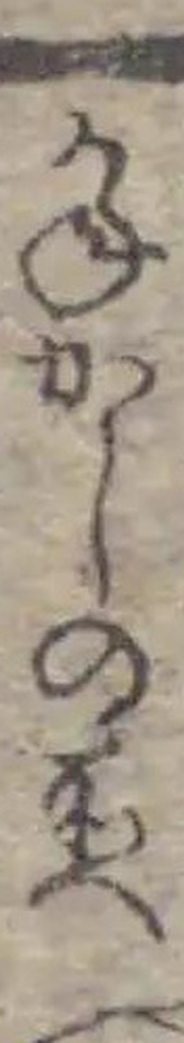かねかしの
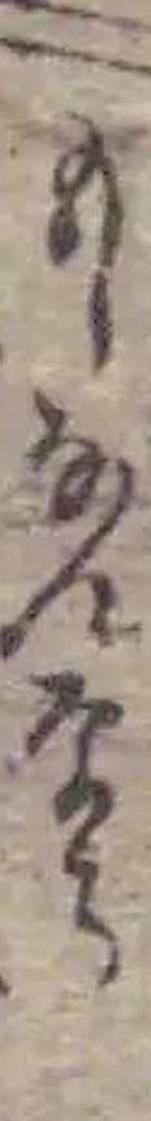もしなんなら
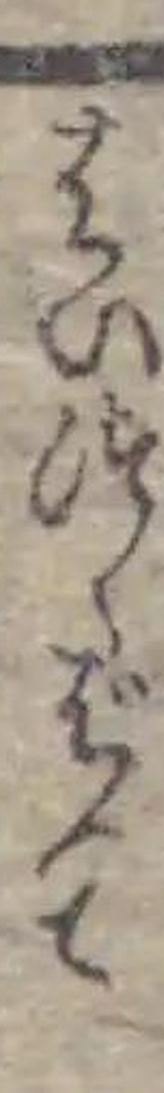はいつくばつて
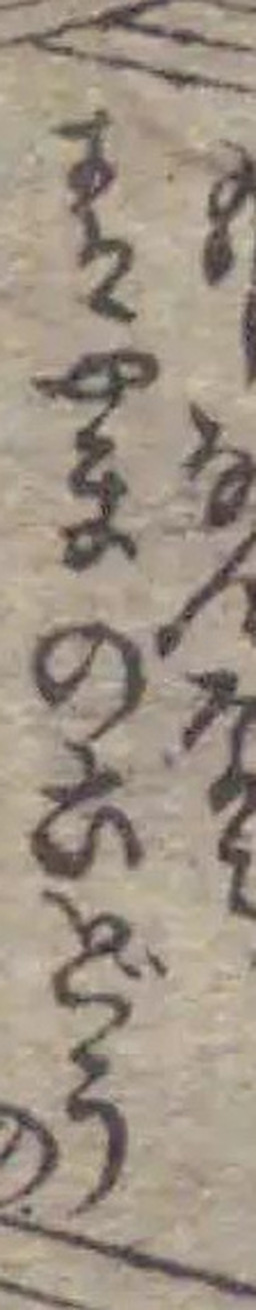〔青やま〕の六どうの
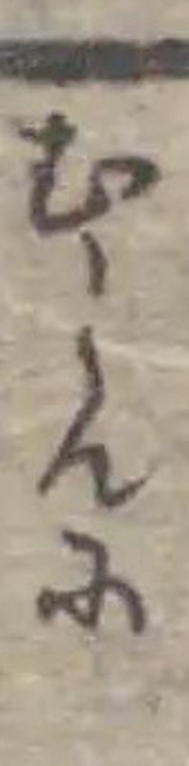むしんに
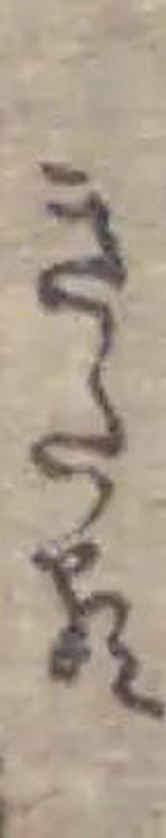きたる
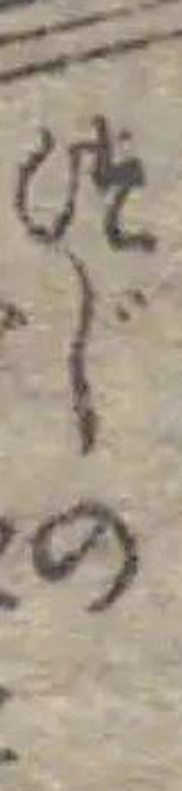つじの
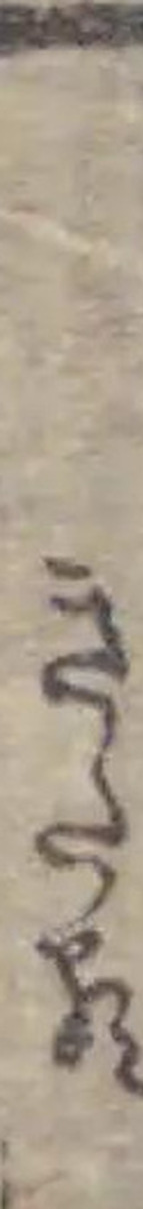きたる
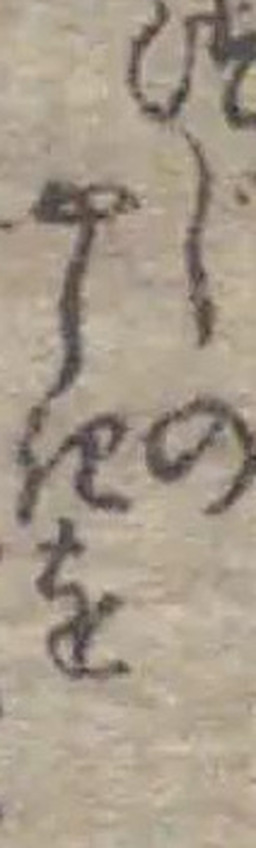やしきを
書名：福壽海旡量品玉 3巻
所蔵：国立国会図書館 National Diet Library, JAPAN
